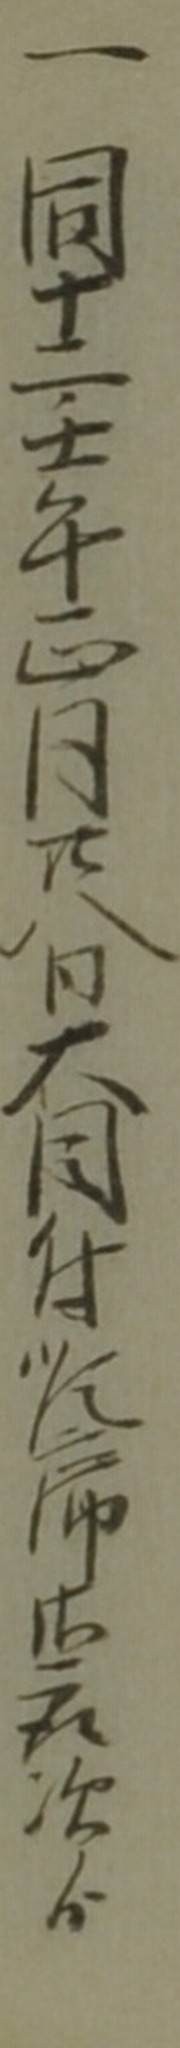一同十二壬午正月廿八日大目付順席御取次ゟ
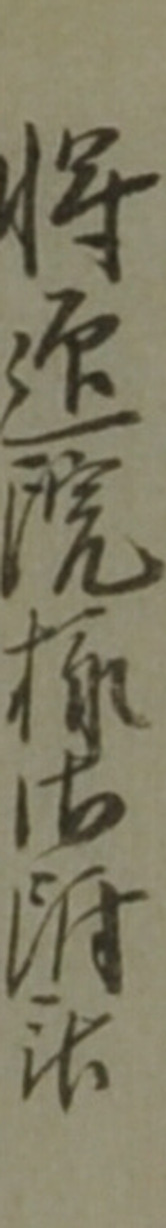将迎院様御附被
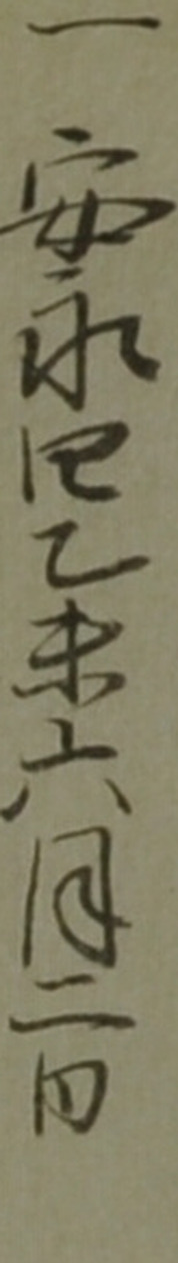一安永四乙未六月二日
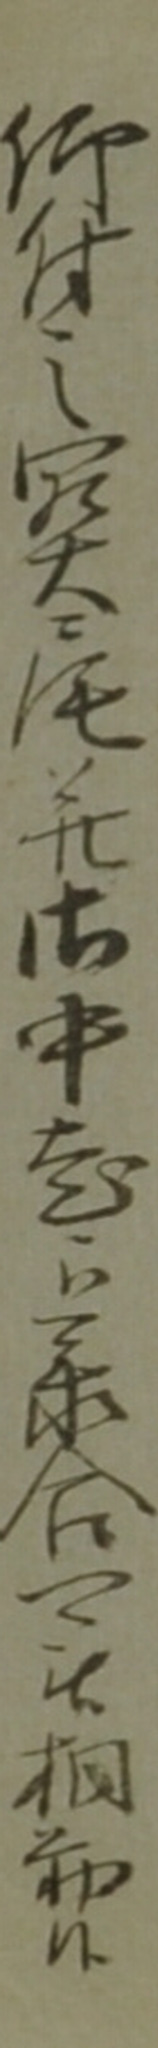仰付之◻︎尾并御中老江承合可被相勤候
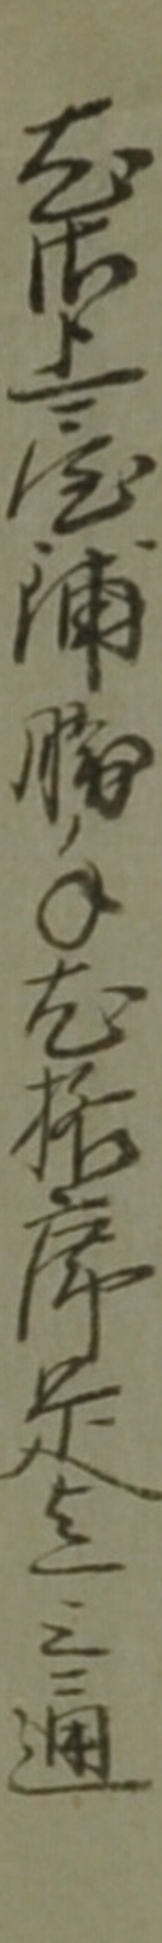尤御上屋鋪勝手尤格席是迄之通
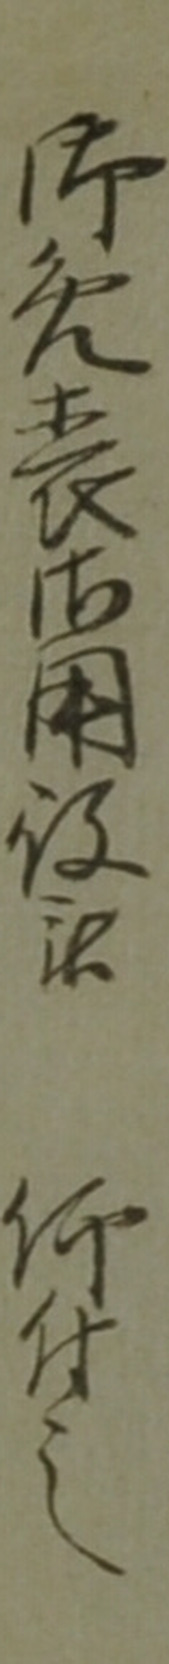御免表御用役被仰付之
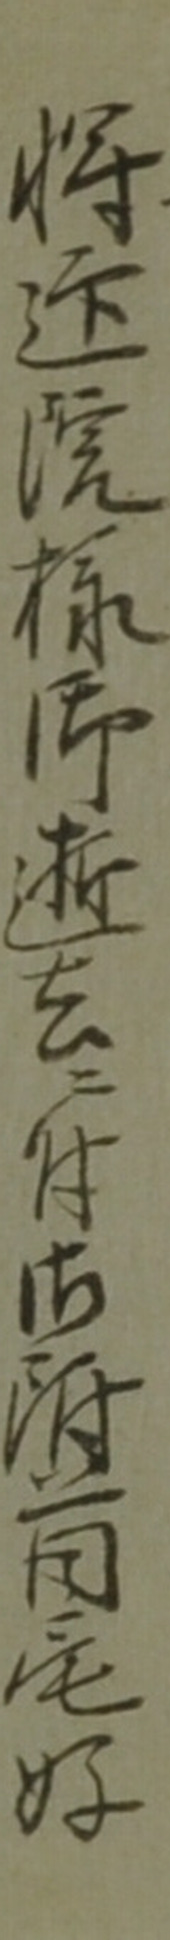将迎院様御逝去ニ付御附首尾好
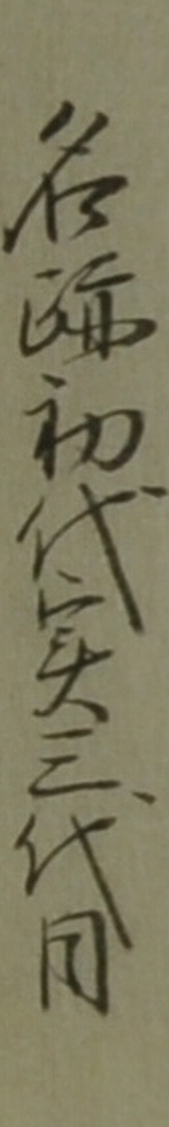名跡初代実三代目
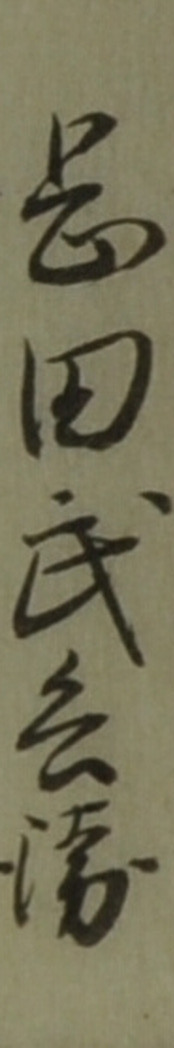岡田武兵衛
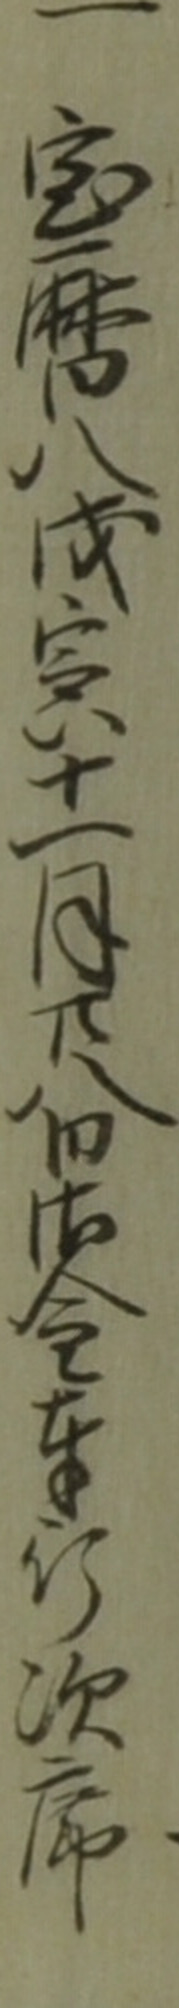一宝暦八戊寅十一月廿八日御金奉行次席

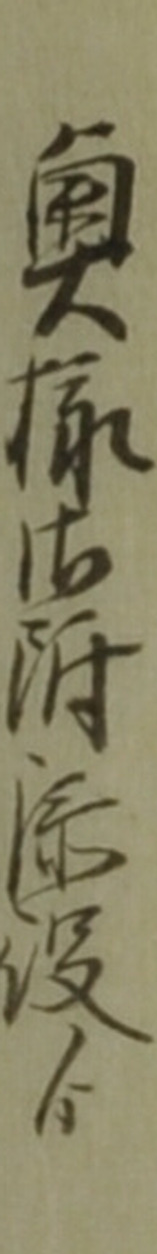奥様御附添役ゟ
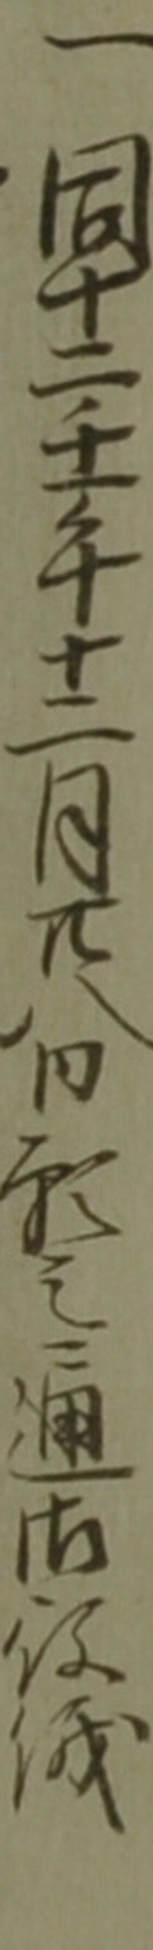一同十二壬午十二月廿八日願之通御役儀
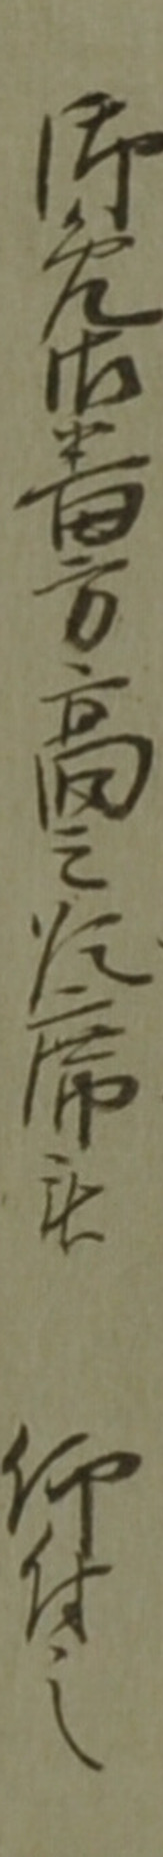御免御番方高之順席被仰付之
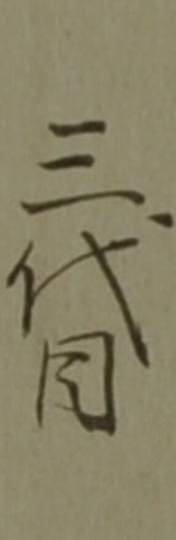三代目
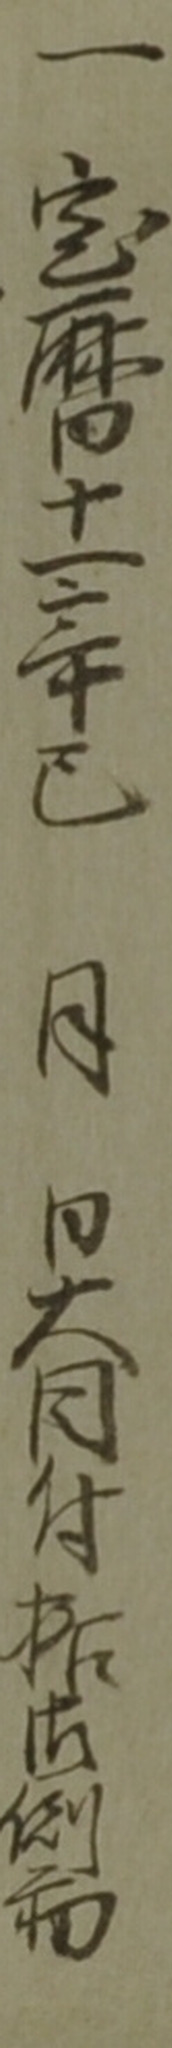一宝暦十一辛巳月日大目付格御側勤
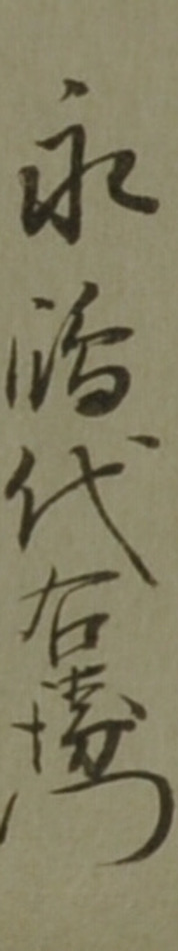永嶋代右衛門
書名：諸御役代々録（六）
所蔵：伊那市立高遠町図書館・合同会社AMANE
